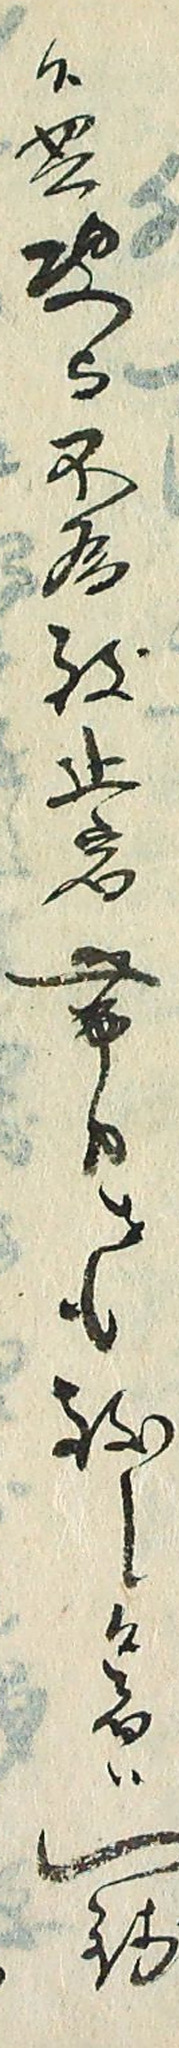候共決而不為致止宿帯刀をも致し候者は一銭
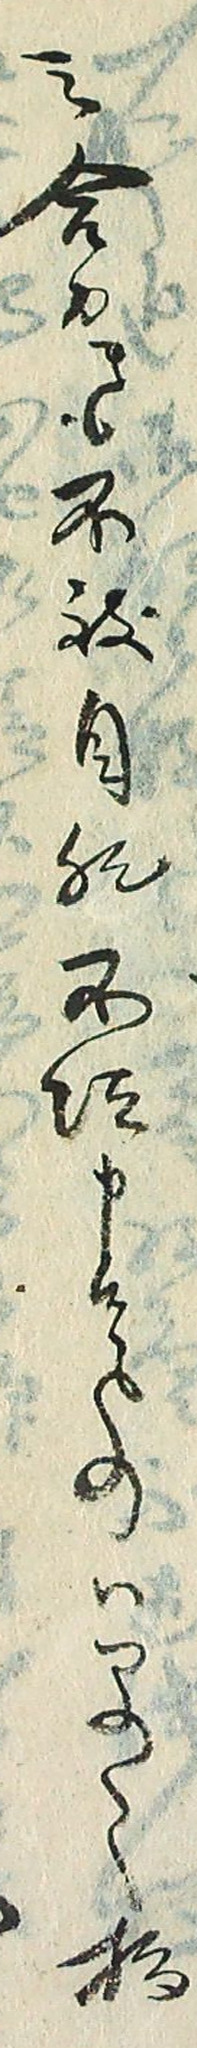之合力をも不致自然不法申候ものは早々指
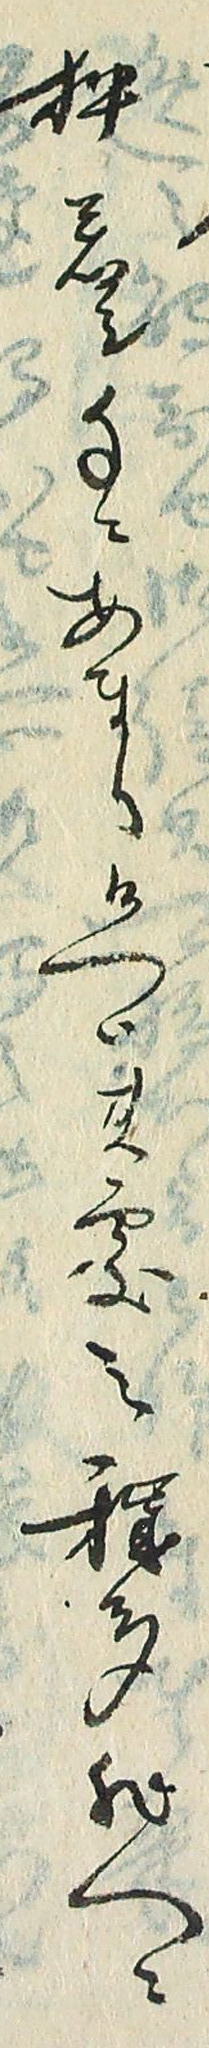押若し手にあまり候へは其処の穢多非人に
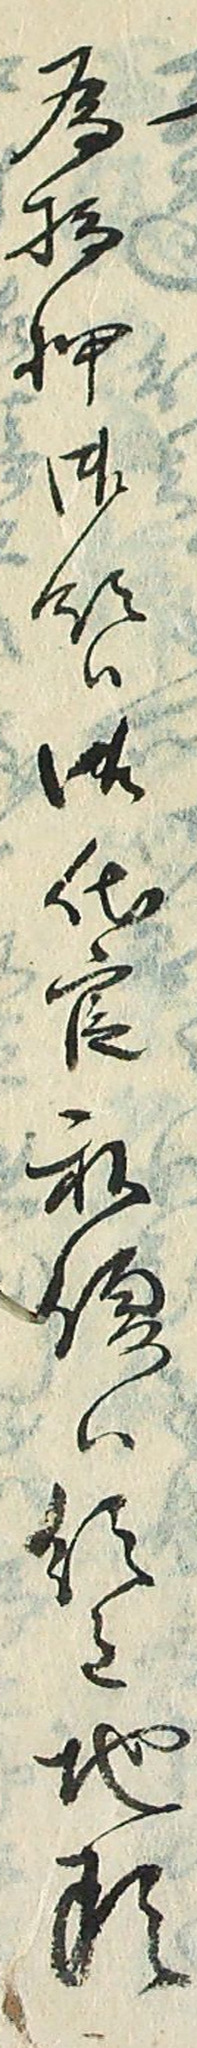為指押御領は御代官私領は領主地頭
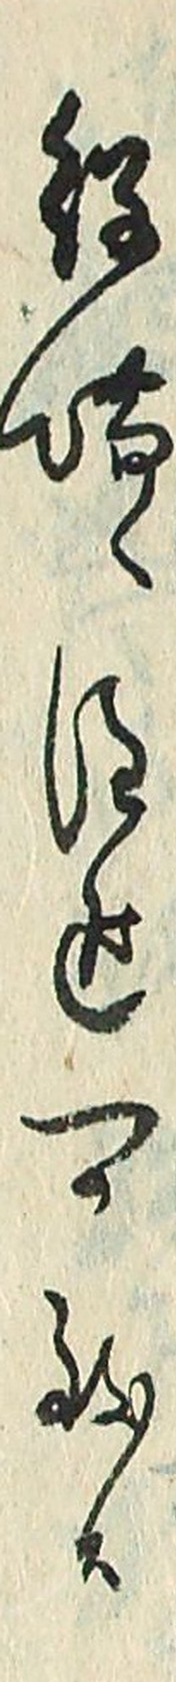役場へ注進可致候
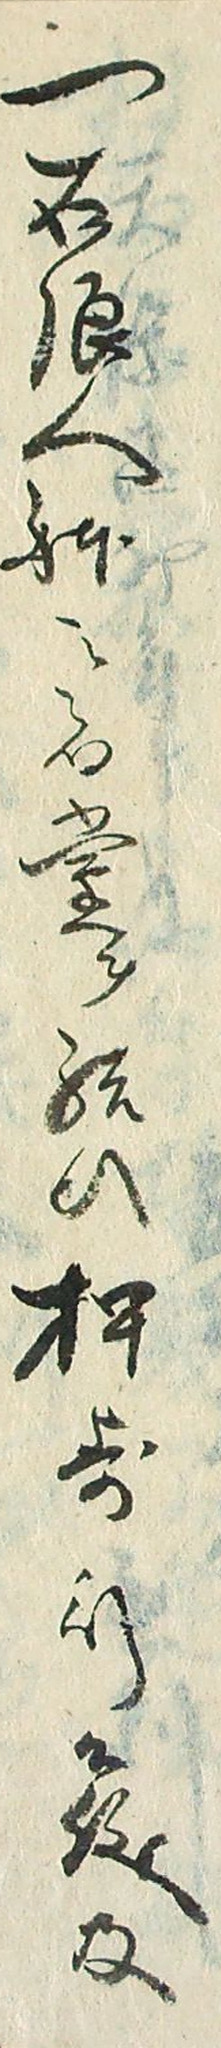一右浪人体之者党を結ひ押歩行候儀及
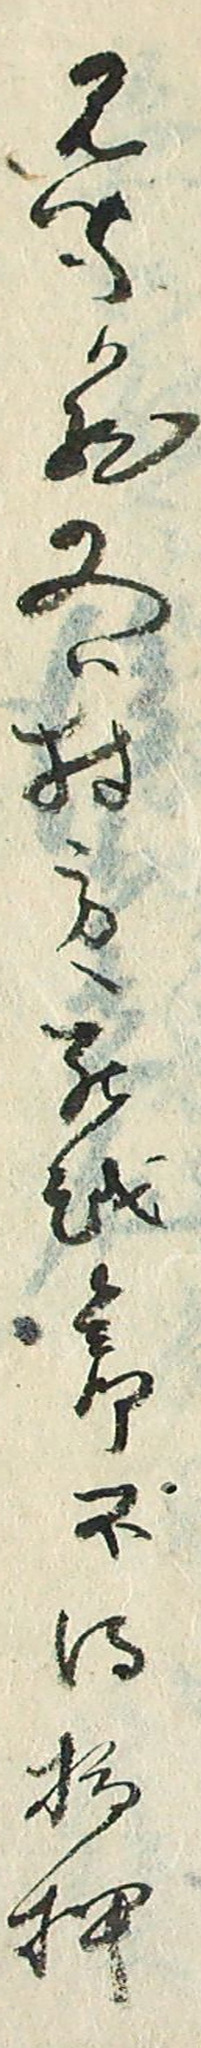見聞候歟又は村方へ罷越候節不得指押

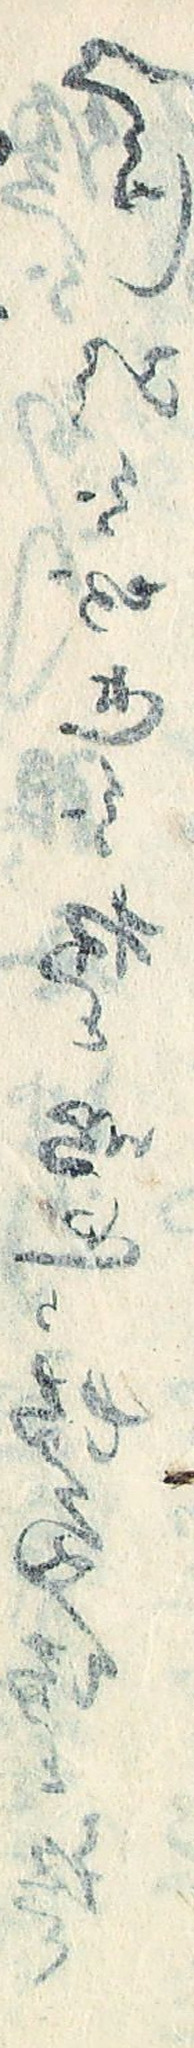卯十月十一日
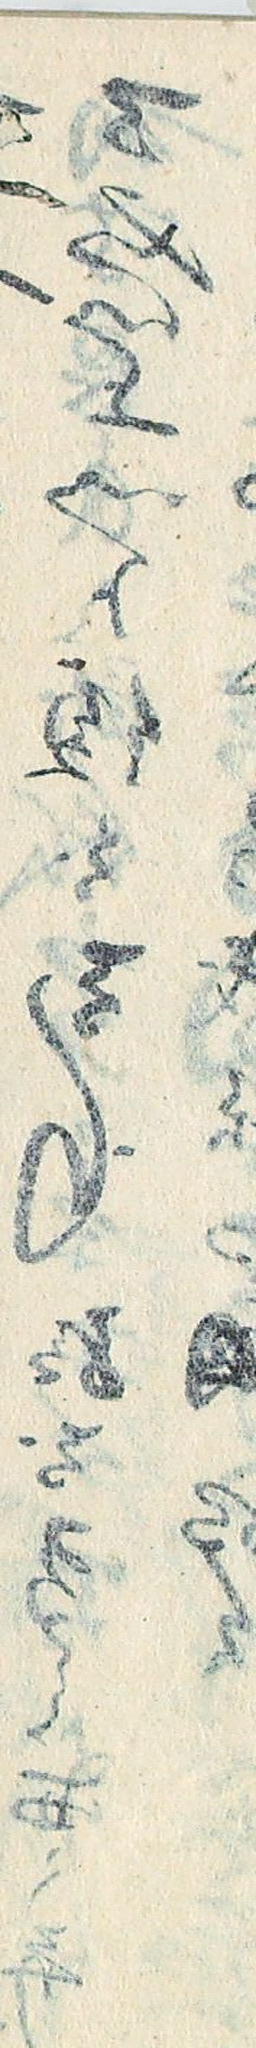卯十月十一日
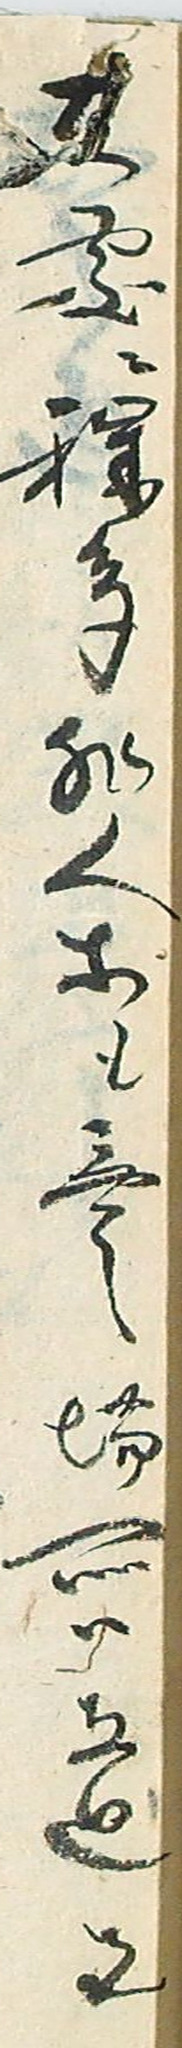其処に穢多非人無之場所は立廻先
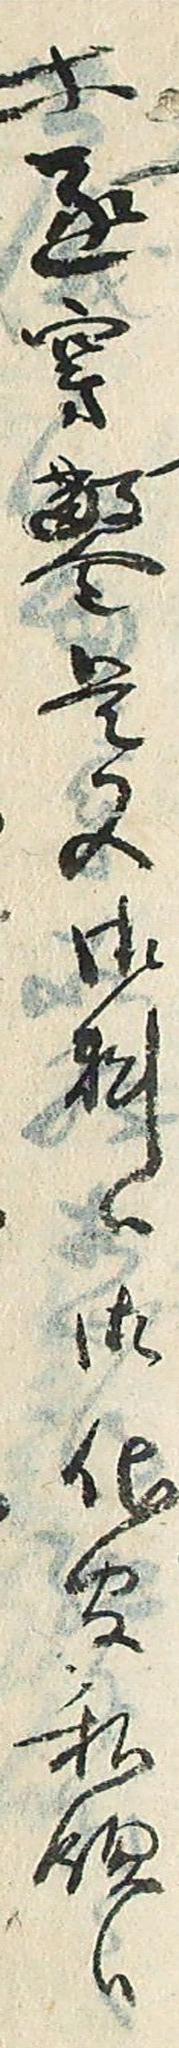抔遂穿鑿是又御料は御代官私領は
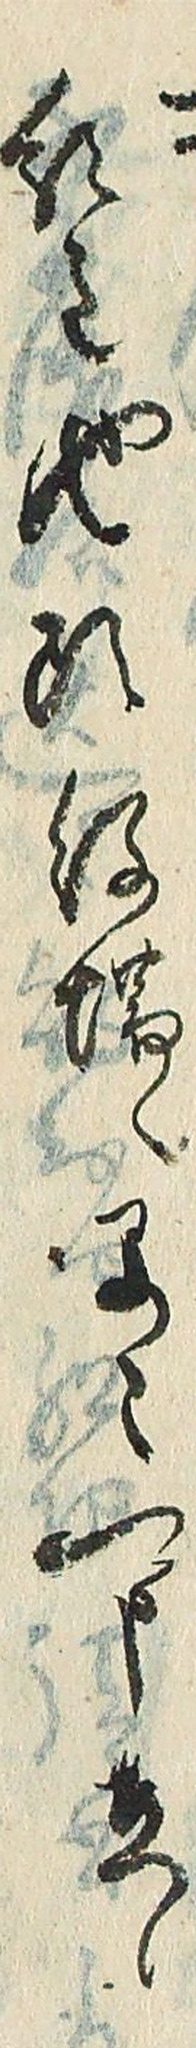領主地頭役場へ早々可申立候
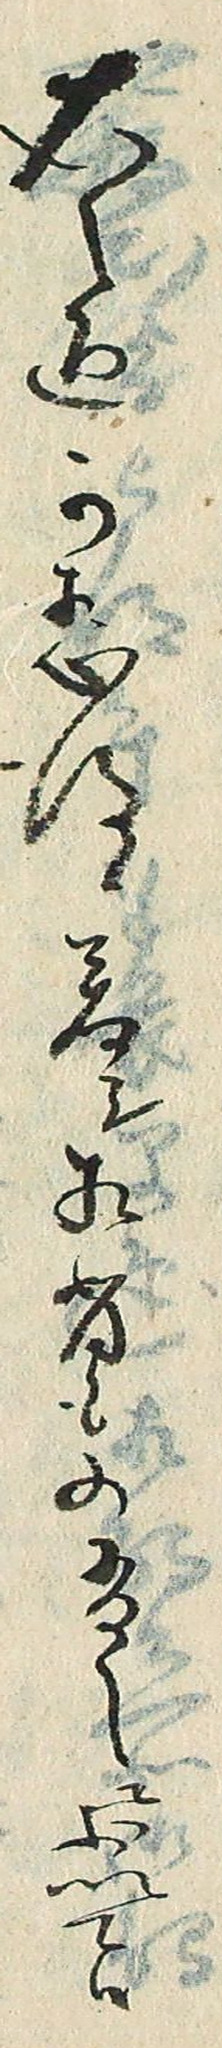右之通可相心得候若し相背もの有之においては
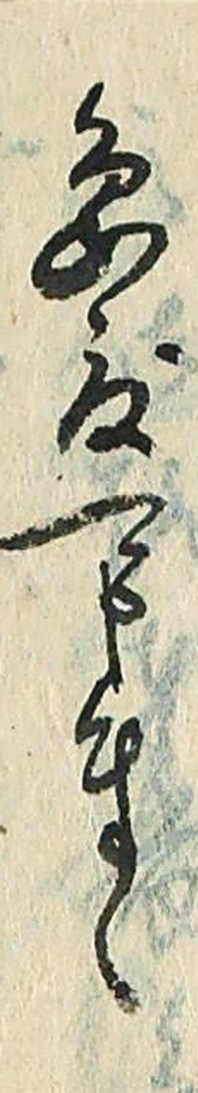急度可申付候
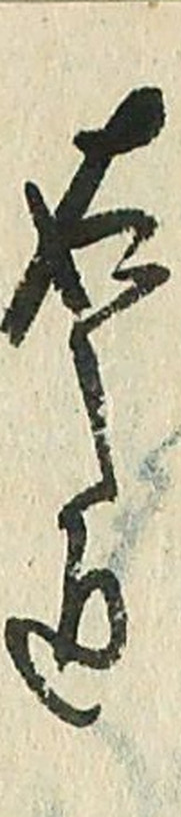右之通
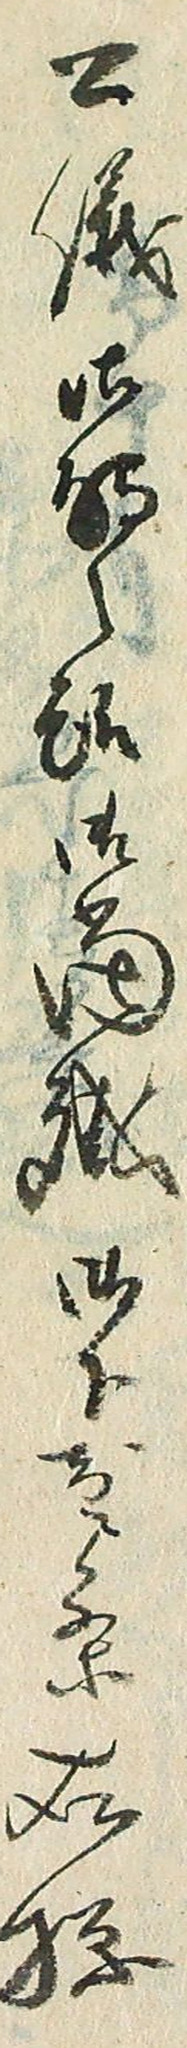公義御触之趣御当職御下知に候条右様
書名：諸御用御□受書控
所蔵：鳴門教育大学 Naruto University of Education
